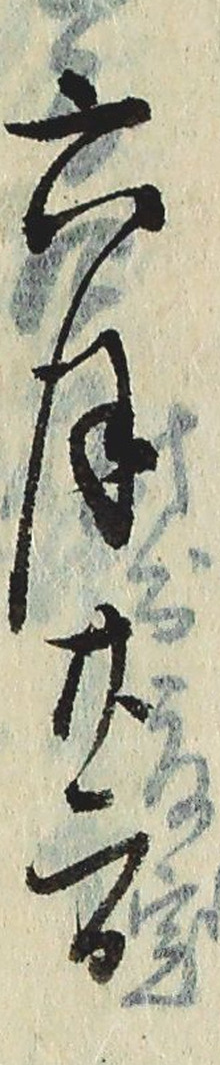六月廿二日
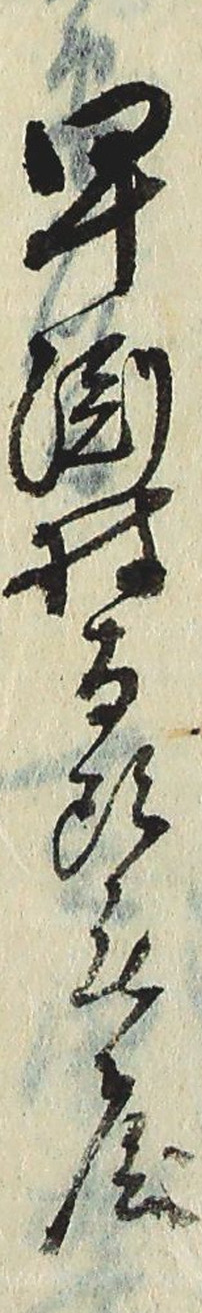早淵村与頭庄屋
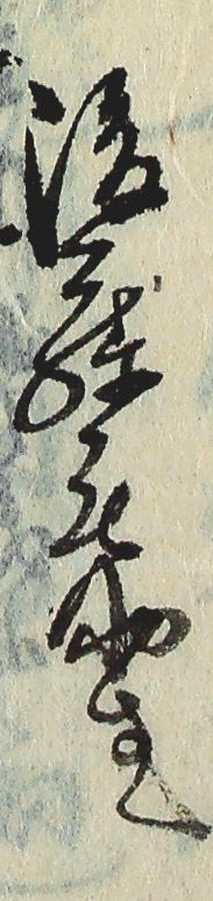後藤庄助方へ
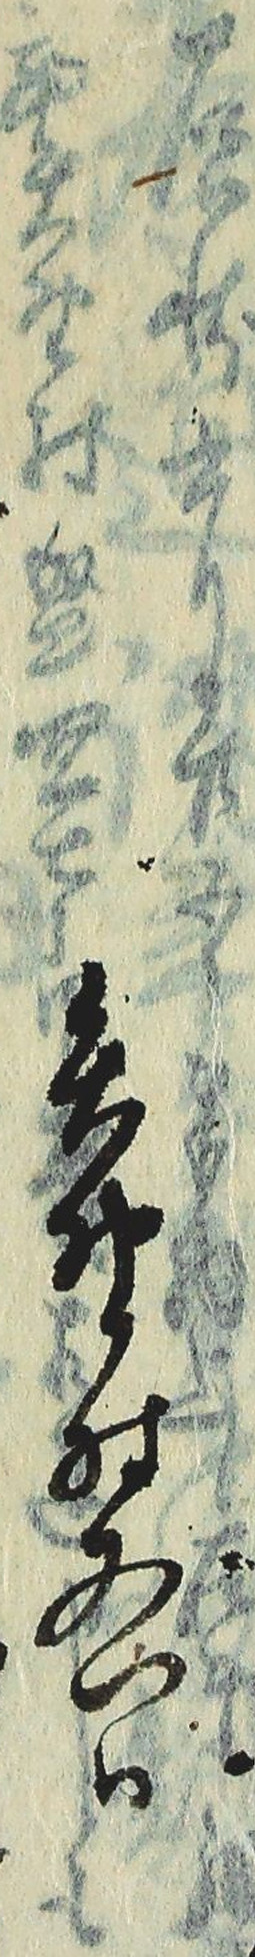矢野村右同
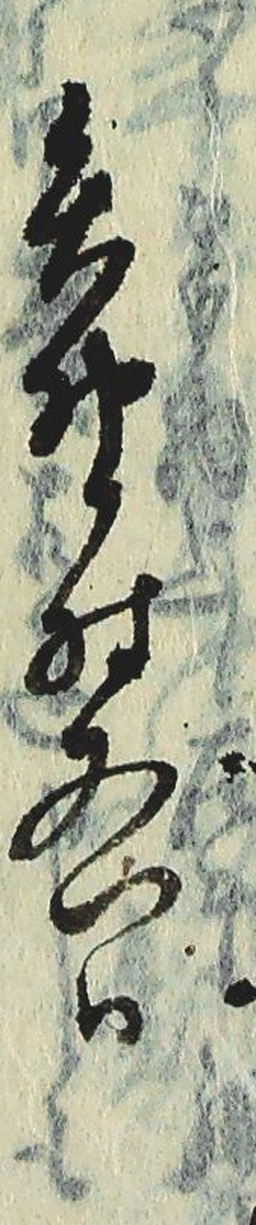矢野村右同
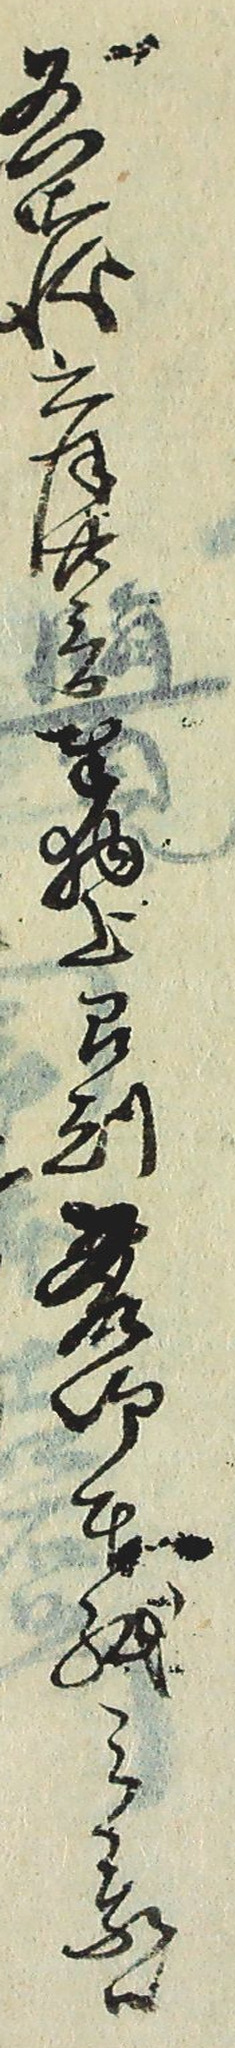右御状六月廿三日奉拝上即刻右御本紙之義は
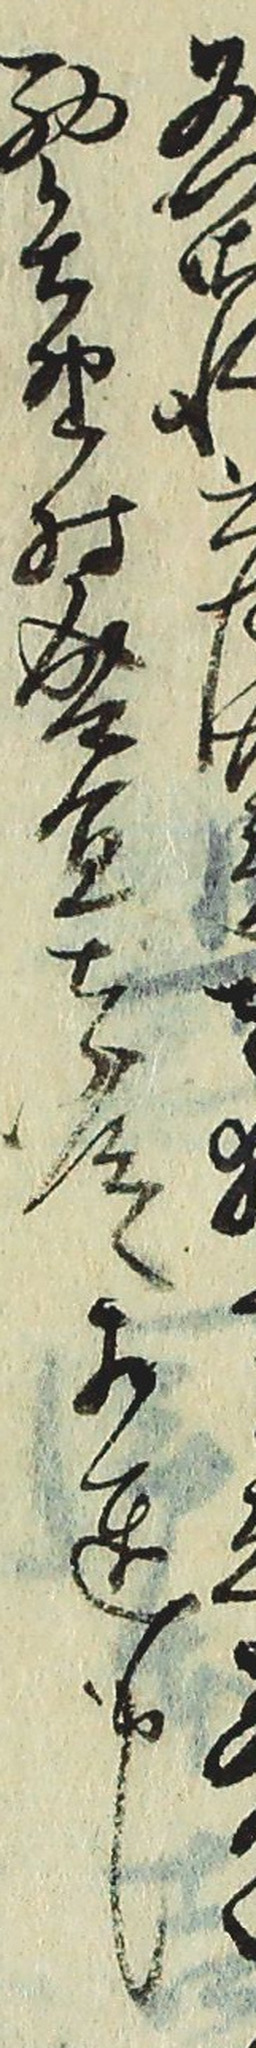西矢野村盛宣七郎殿へ相達申候
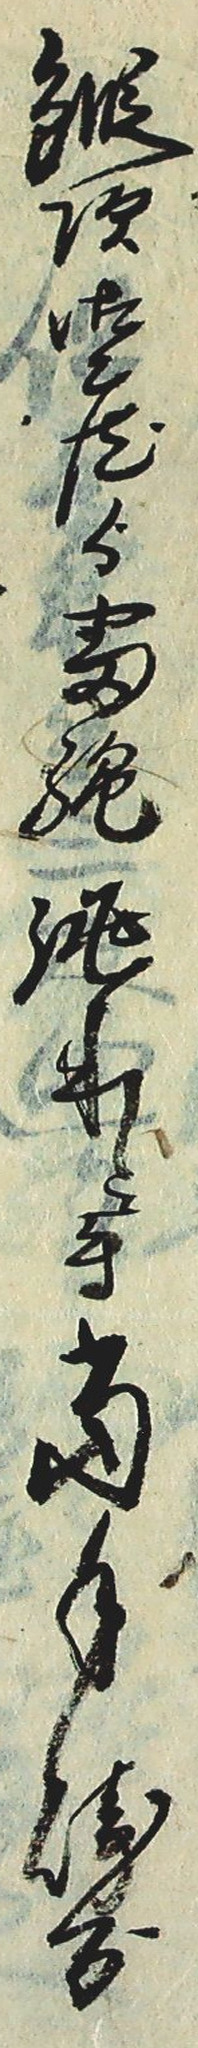鰕次御庭ゟ番縄誂来候に付当年俵分
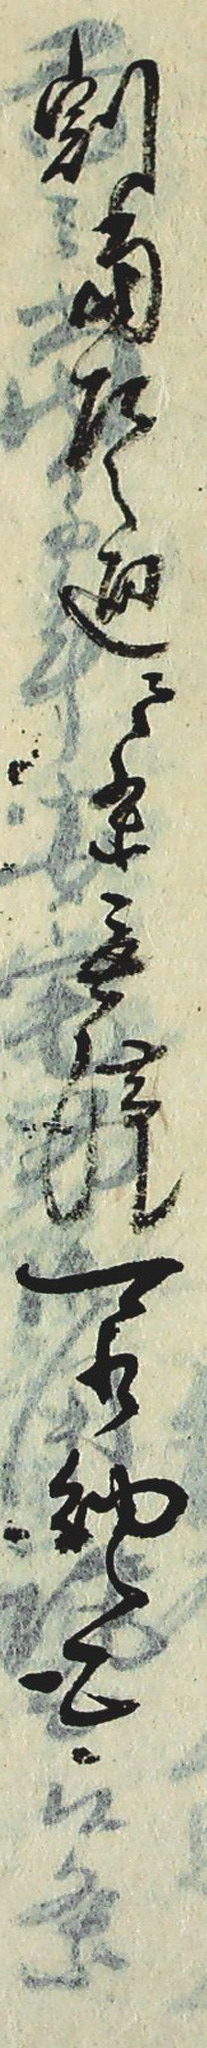割当左之通に候条無滞可相納候以上
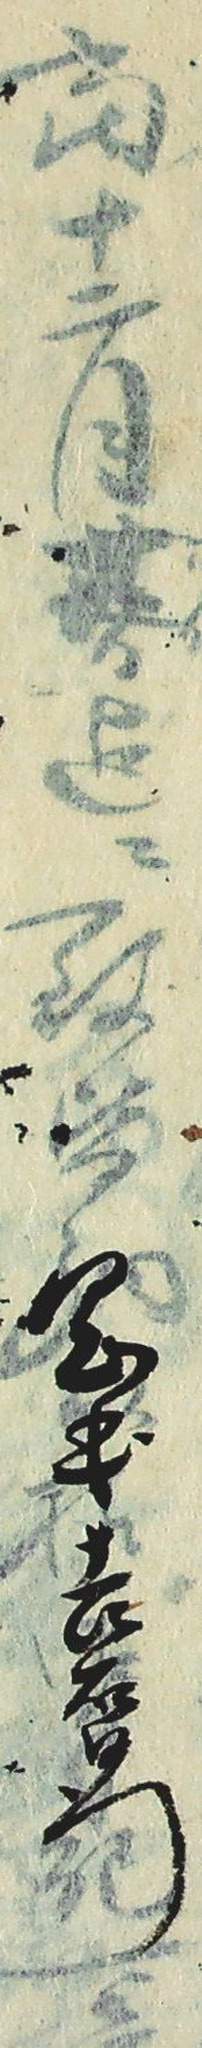岡本吉右衛門
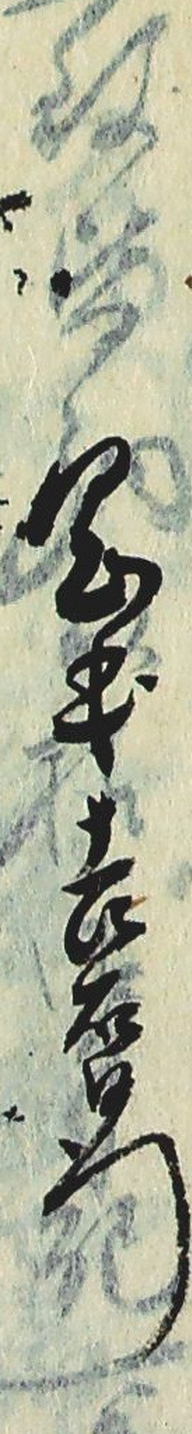岡本吉右衛門
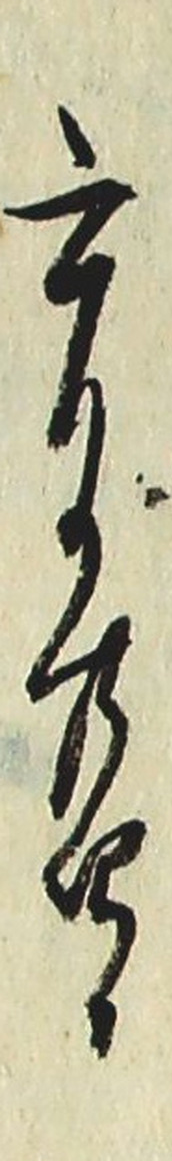六月廿四日
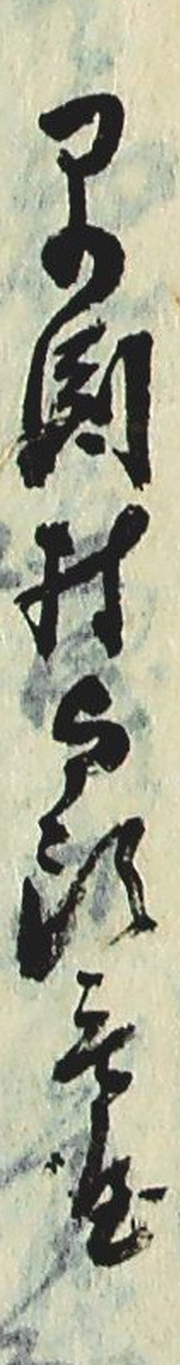早淵村与頭庄屋
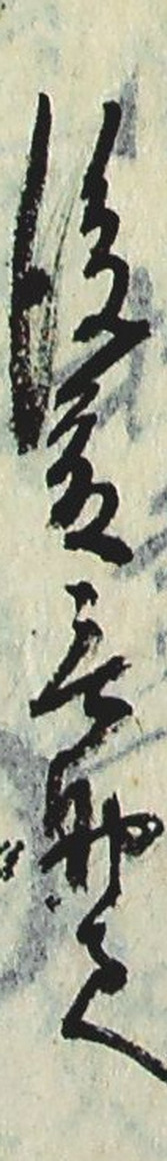後藤庄助方へ
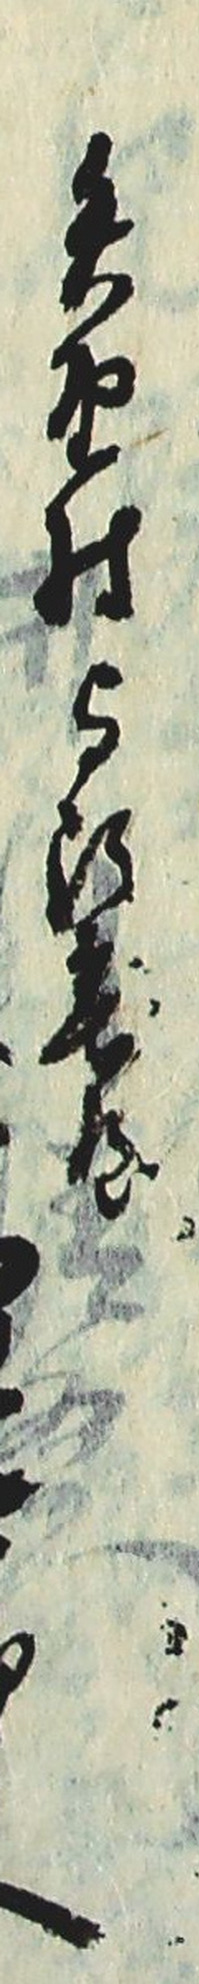早淵村与頭庄屋
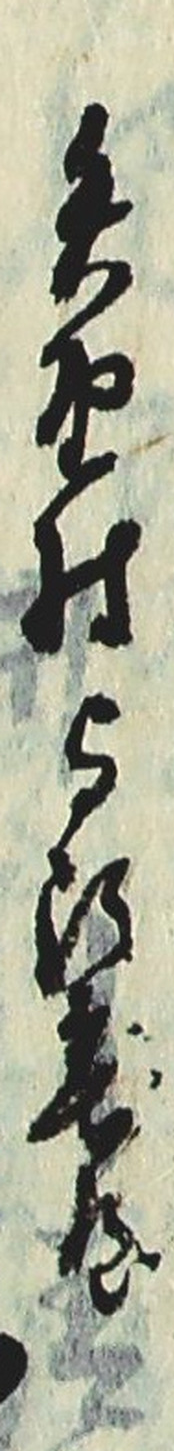早淵村与頭庄屋
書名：名東郡中諸割賦元帳
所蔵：鳴門教育大学 Naruto University of Education
